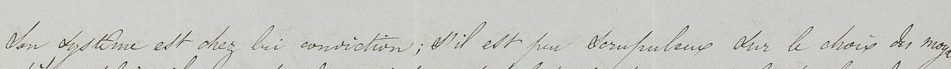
Son système est chez lui conviction; s'il est peu scrupuleux sur le choix des moyens
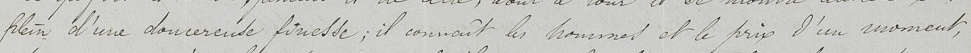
plein d'une doucereuse finesse; il connaît les hommes et le prix d'un moment,
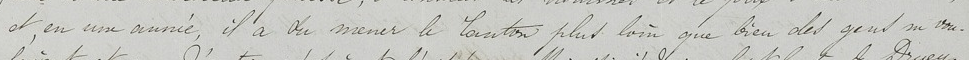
et, en une année, il a du mener le Canton plus loin que bien des gens ne vou-
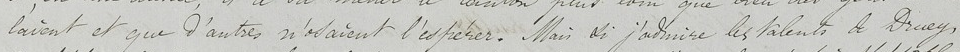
laient et que d'autres n'osaient l'espérer. Mais si j'admire les talents de Druey,
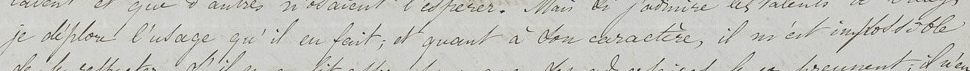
je déplore l'usage qu'il en fait; et quant à son caractère, il m'est impossible
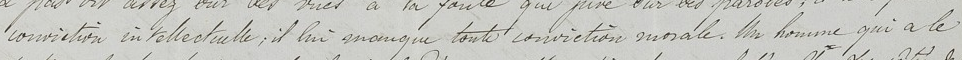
conviction intellectuelle; il lui manque toute conviction morale. Un homme qui a le
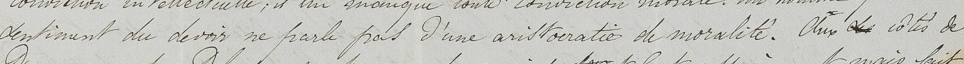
sentiment du devoir ne parle pas d'une aristocratie de moralité. Aux ses côtés de
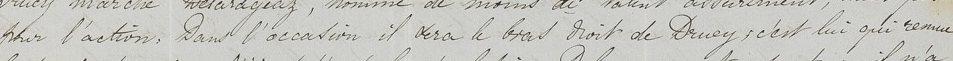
pour l'action. Dans l'occasion il sera le bras droit de Druey; c'est lui qui remue
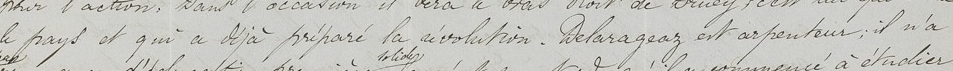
le pays et qui a déjà préparé la révolution. Delarageaz est arpenteur; il n'a
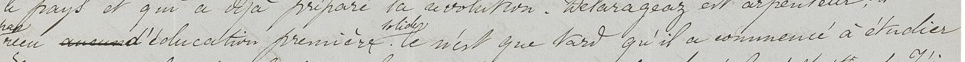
rien aucun d'éducation première solide . Ce n'est que tard qu'il a commencé à étudier
